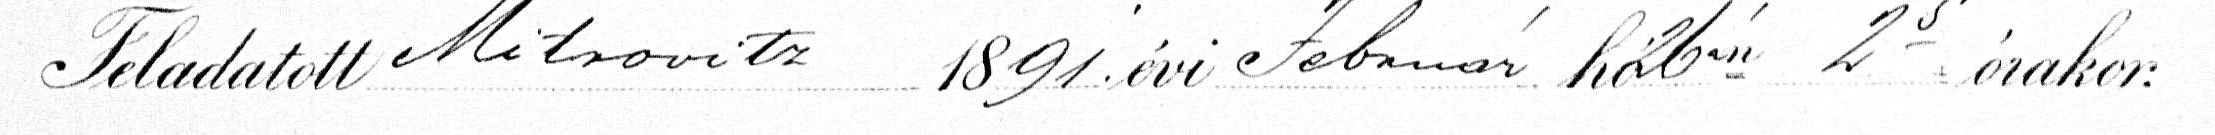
Feladatott: Mitrovitz 1891 évi Február hé26n 25 óraker
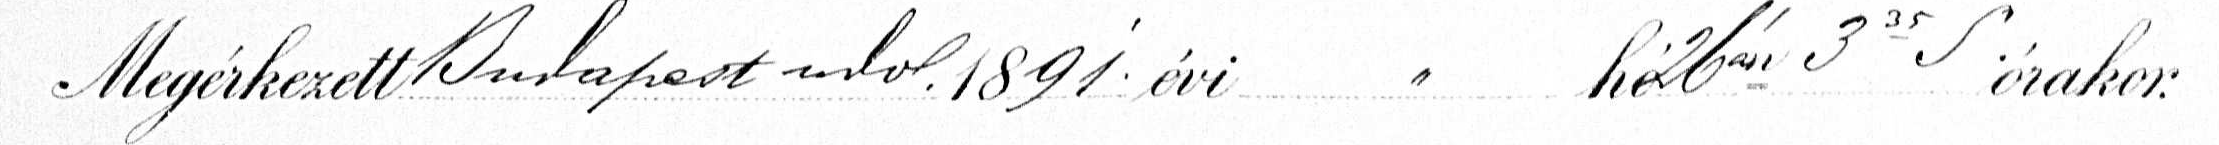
Megérkezett: Budapest ado 1891 évi Február hé 335 óraker
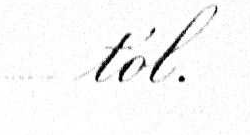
tol.
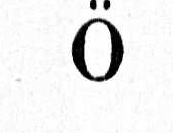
Ö
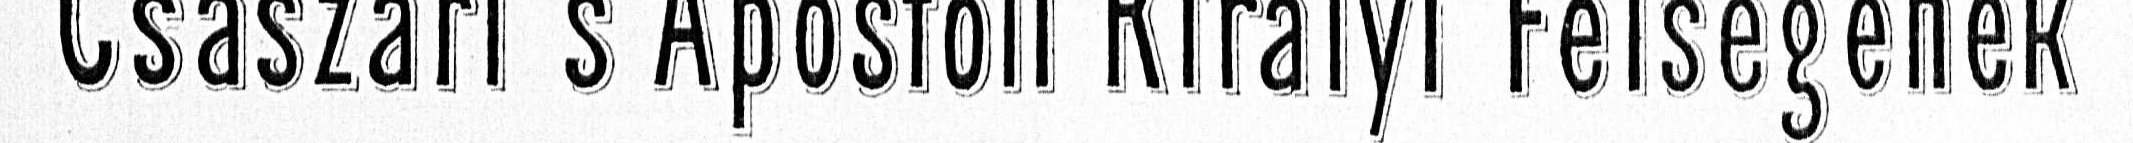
Czászári ś Apostoli Királyi Felségének
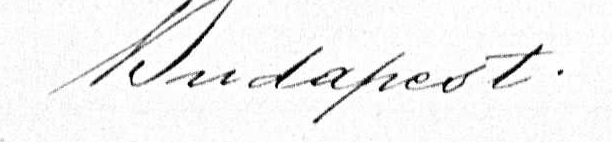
Budapest
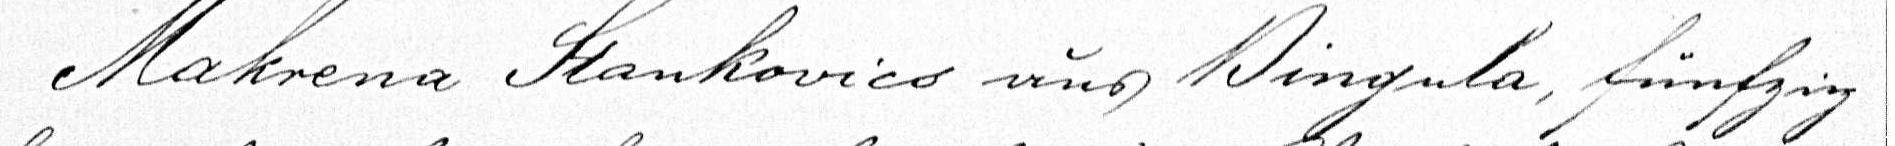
Makrena Stankovics aus Bingula, fünfzig
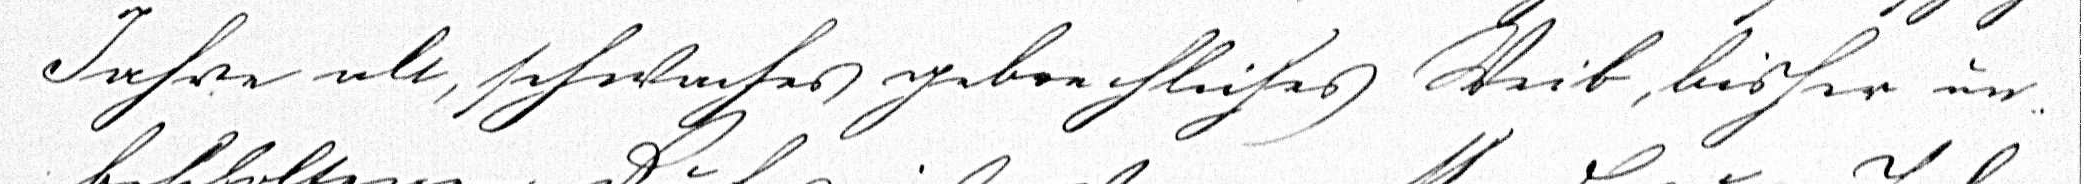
Jahre alt, schwaches gebrechliches Weib, bisher un¬
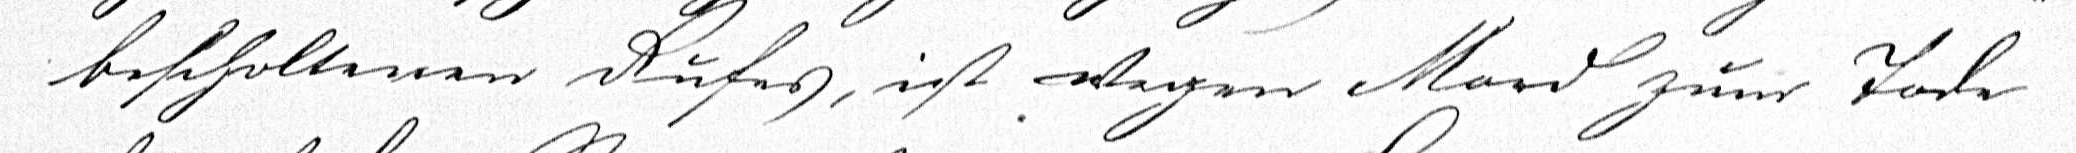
bescholtenen Rufes, ist wegen Mord zum Tode
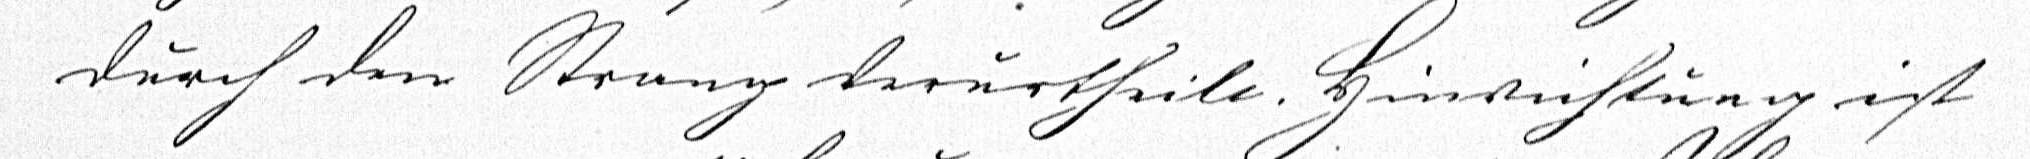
durch den Strang verurtheilt. Hinrichtung ist
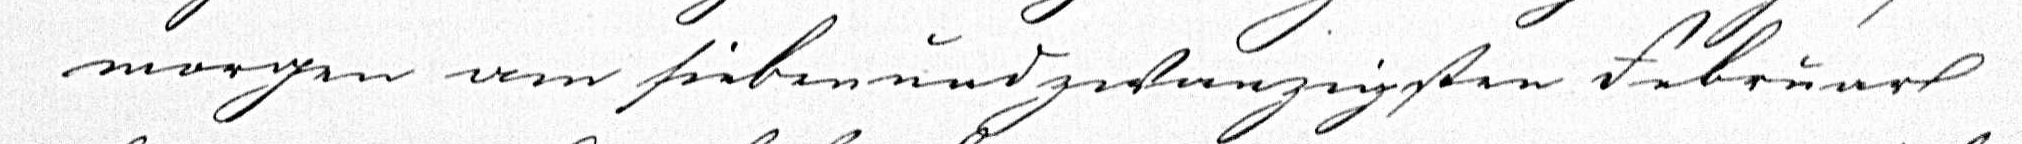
morgen um sieben und zwanzigsten Februar
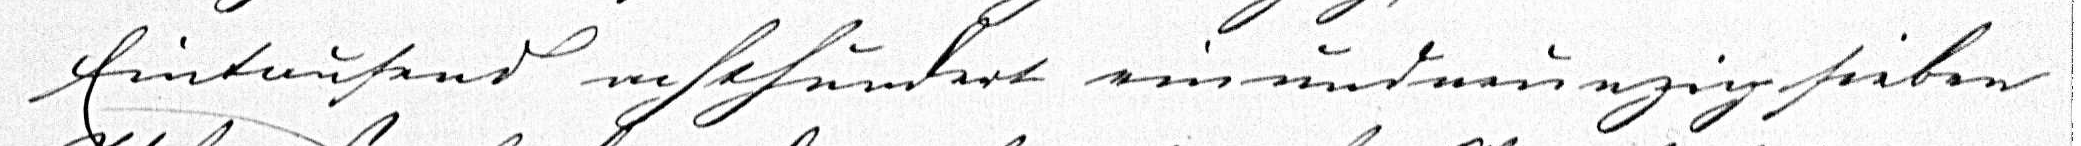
Eintausend achthundert einundneunzig sieben
